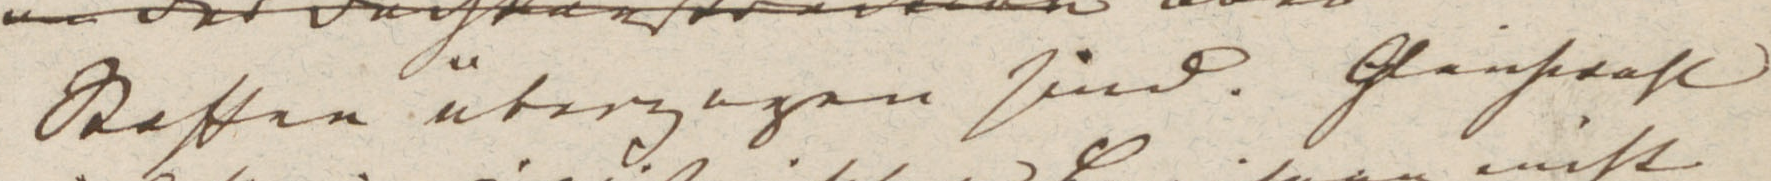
Stoffen überzogen sind. Gleichwohl
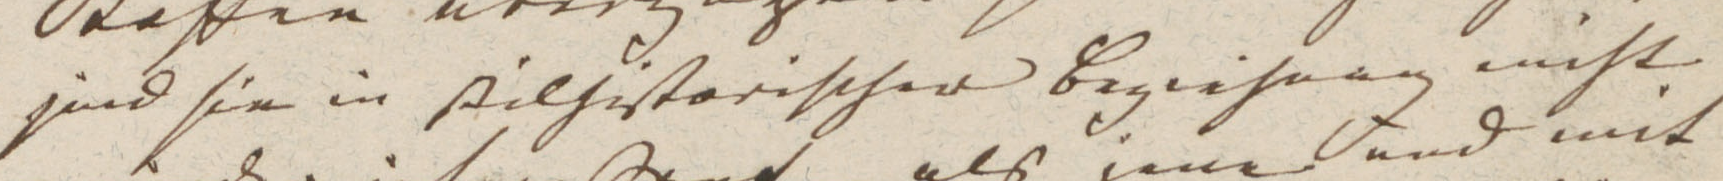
sind sie in stilhistorischer Beziehung nicht
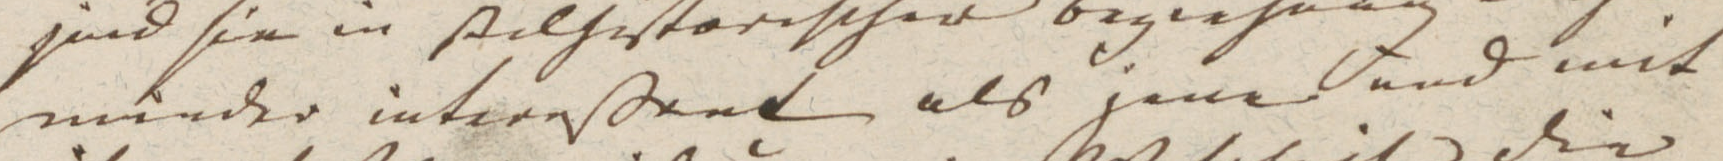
minder interessant als jene und mit
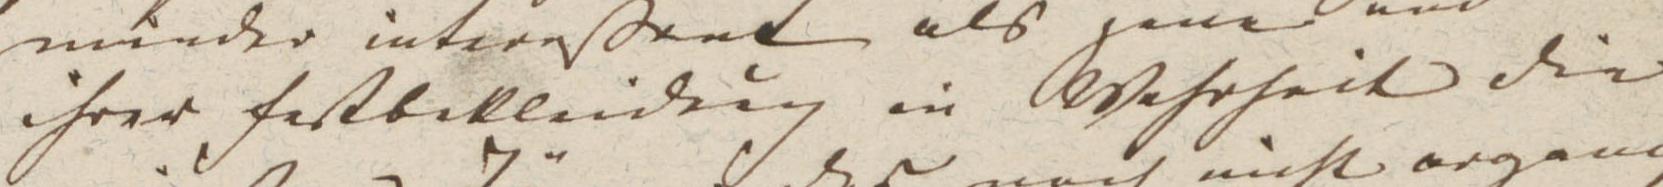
ihrer Festbekleidung in Wahrheit die
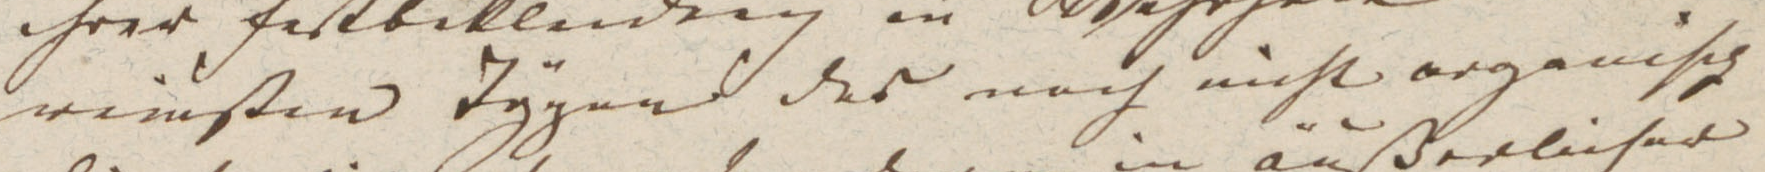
reinsten Typen des noch nicht organisch
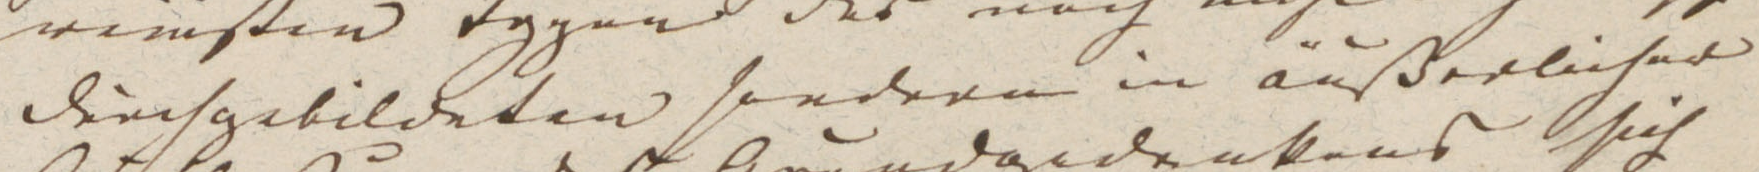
durchgebildeten sondern in äusserlicher
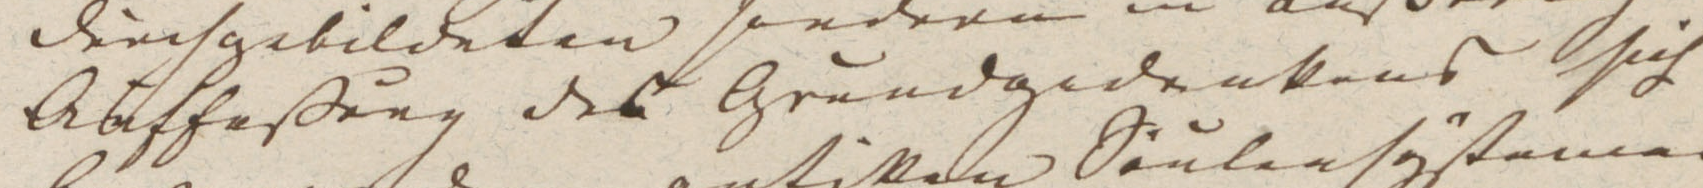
Auffassung des Grundgedankens sich
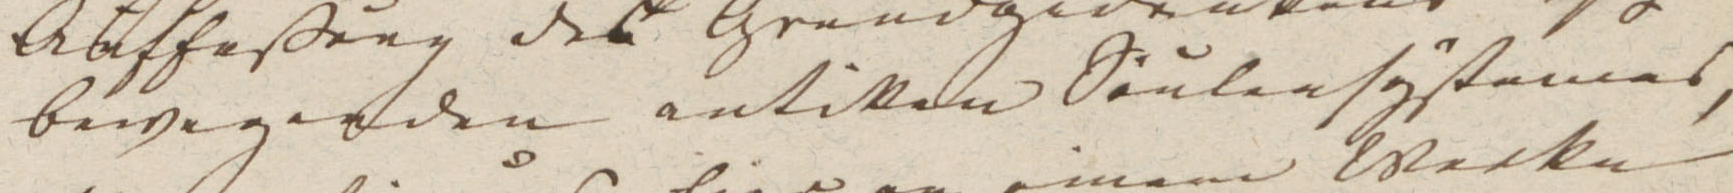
bewegenden antiken Säulensystemes,
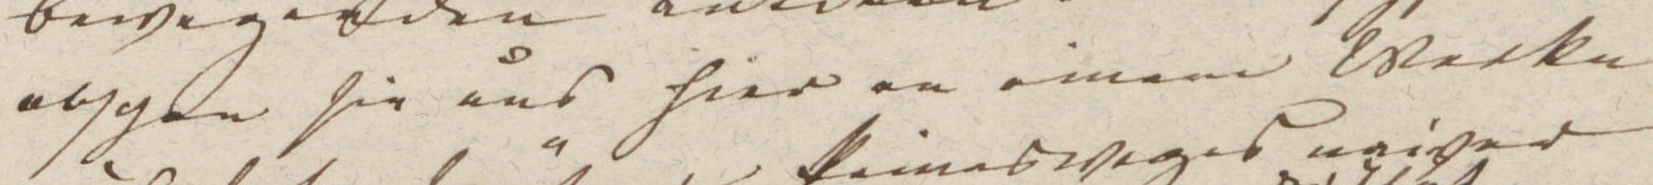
obschon sie uns hier an einem Werke
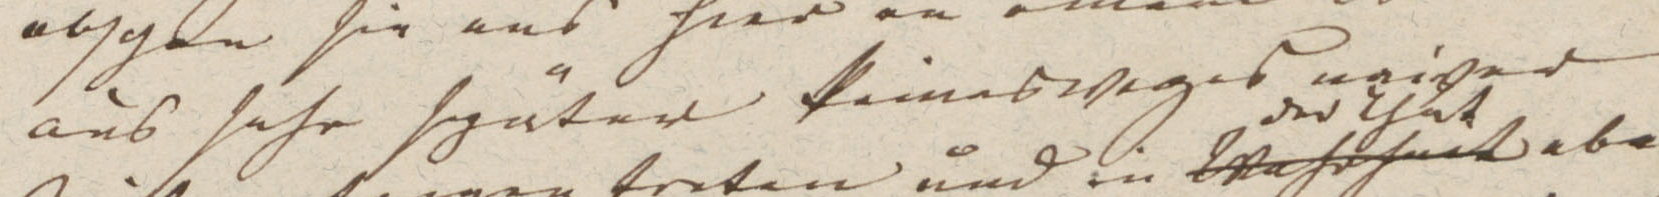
aus sehr später keinesweges naiver
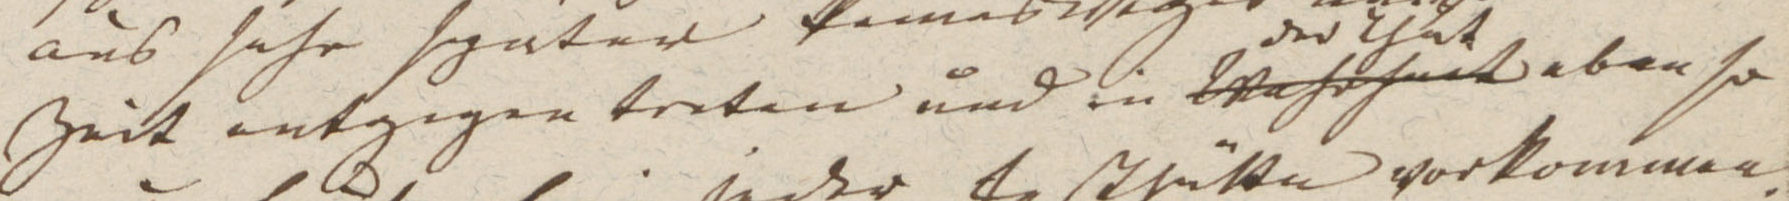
Zeit entgegen treten und in Wahrheit der That eben so
